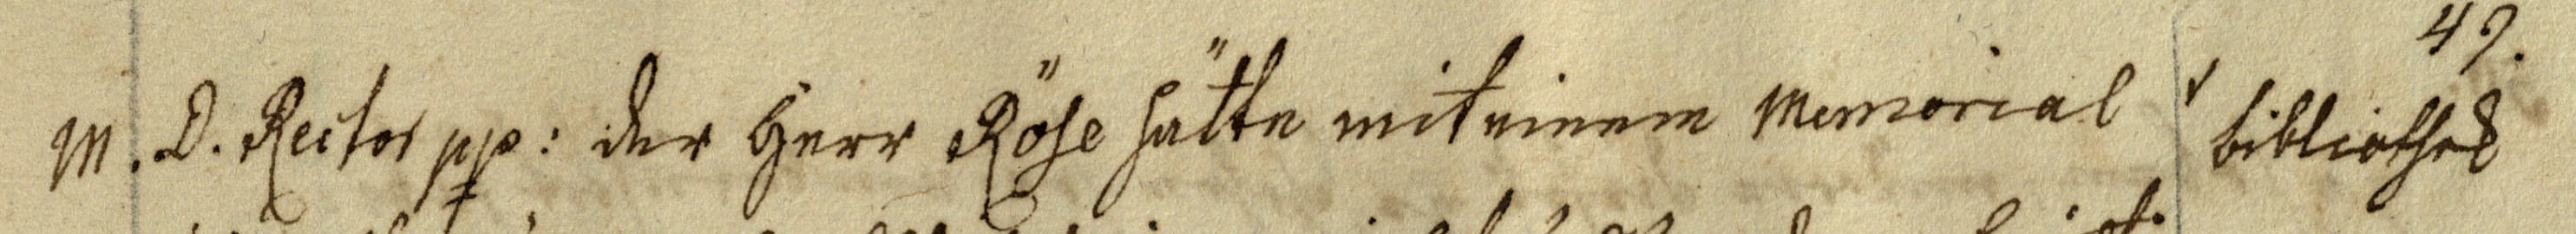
M. D. Rector pp. Der Herr Röse hätte mit einem Memorial
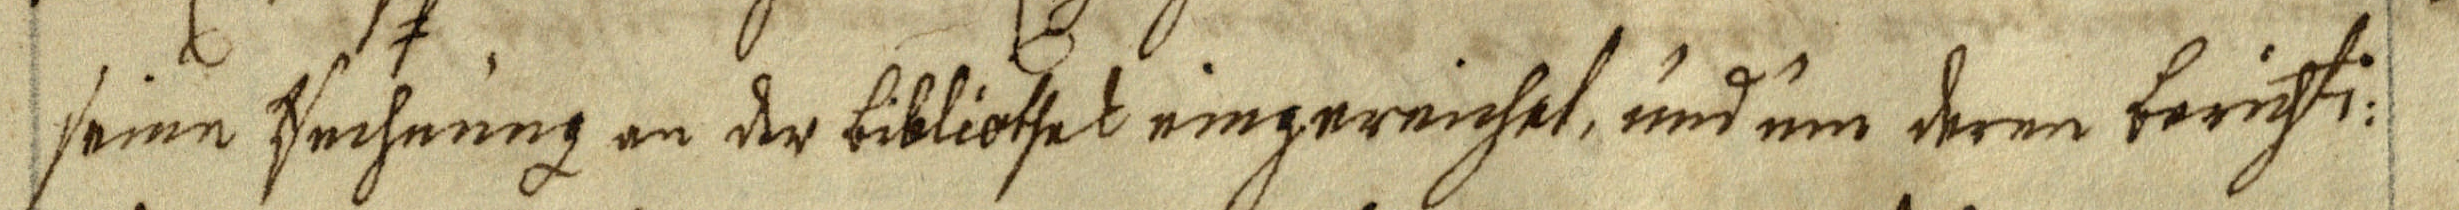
seine Rechnung an der Bibliothek eingereichet, und um deren Berichti¬
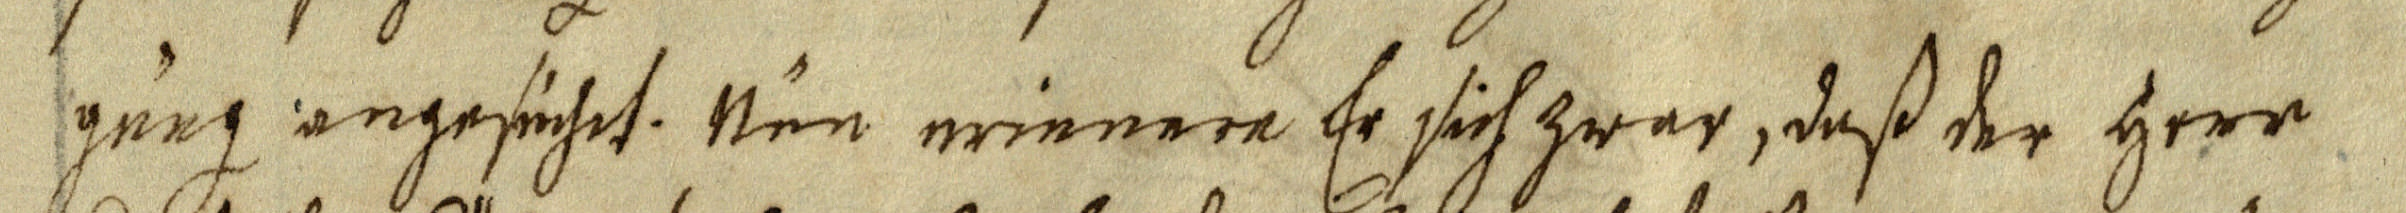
gung angesuchet. Nun erinnere Er sich zwar, daß der Herr
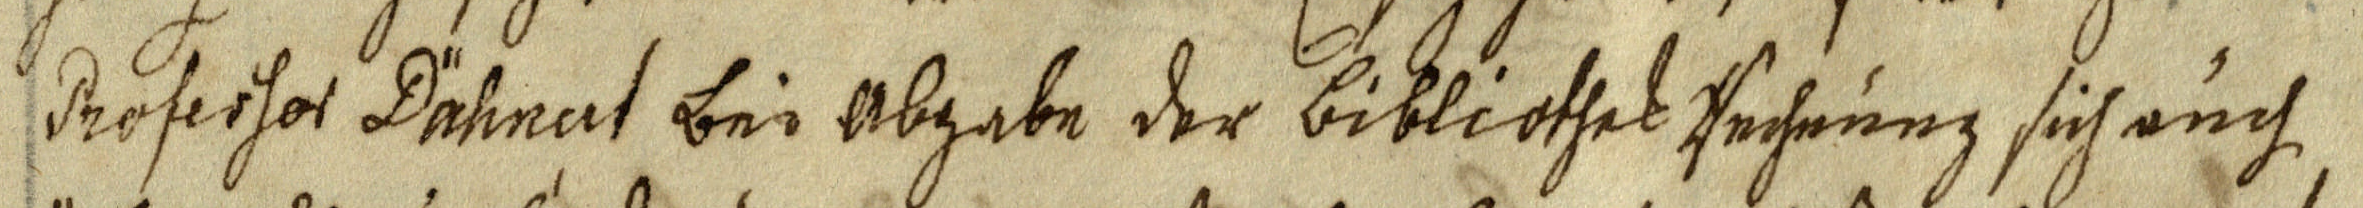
Professor Dähnert bei Abgabe der Bibliothek Rechnung sich auch
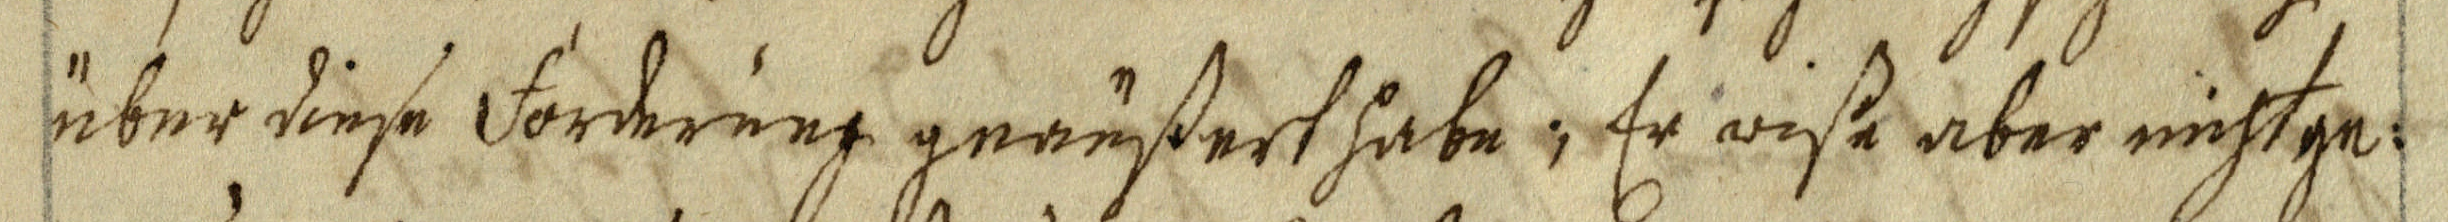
über diese Forderung geäußert habe; Er wiße aber nicht ge¬
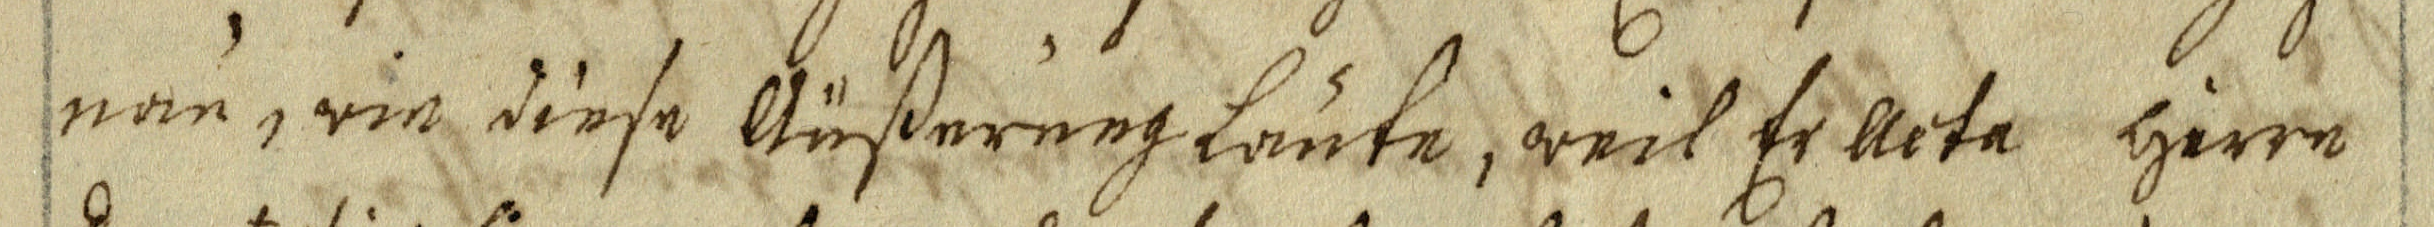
nau, wie diese Äußerung laute, weil Er Acta Herrn
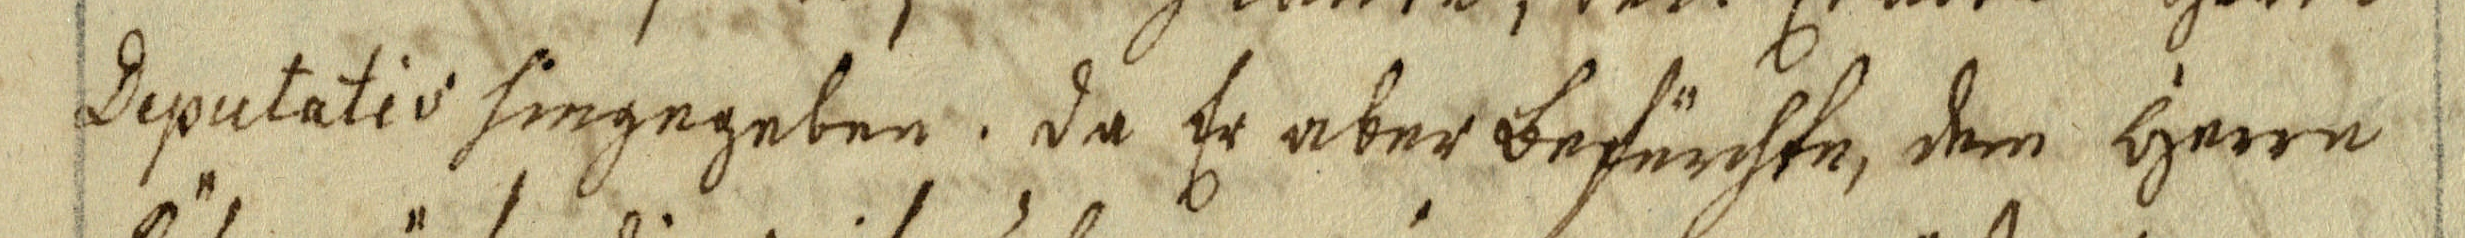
Deputatis hingegeben. Da Er aber befürchte, dem Herrn
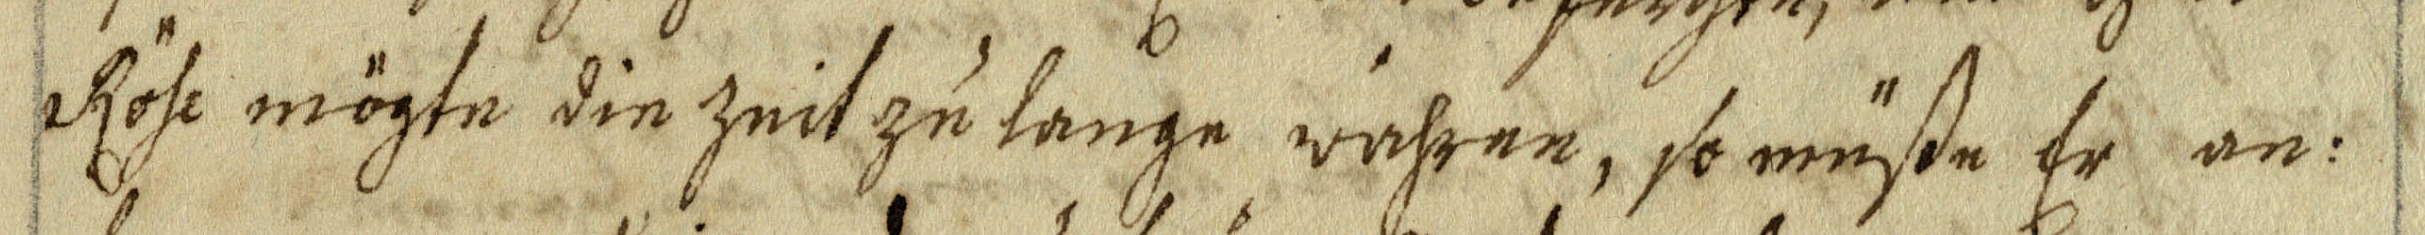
Röse mögte die Zeit zu lange währen, so müße Er an¬
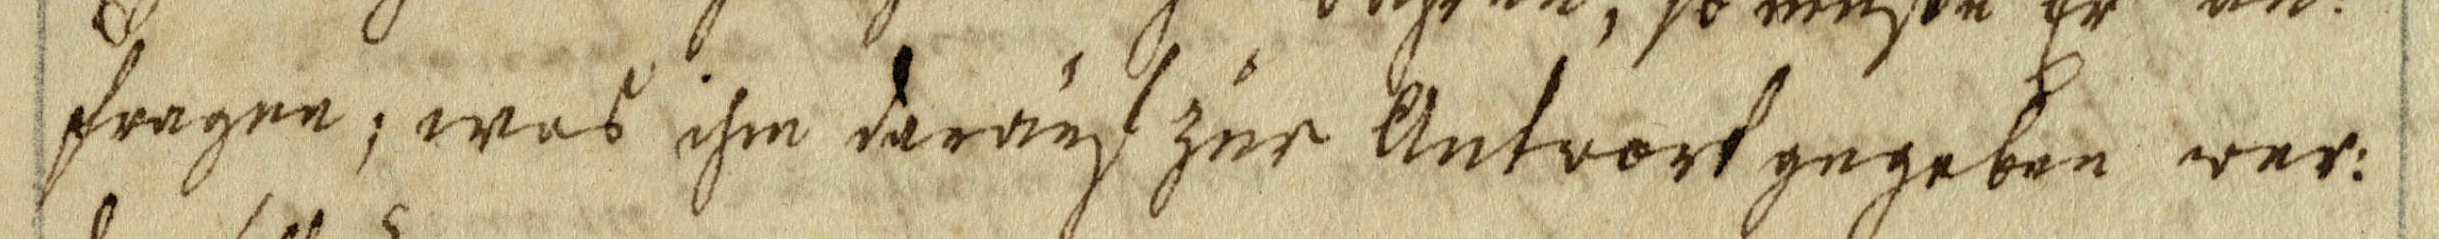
fragen; was ihm darauf zur Antwort gegeben wer¬
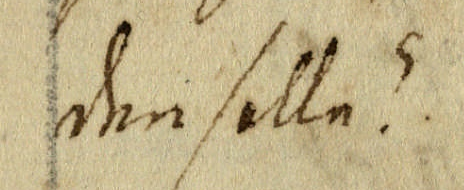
den solle?
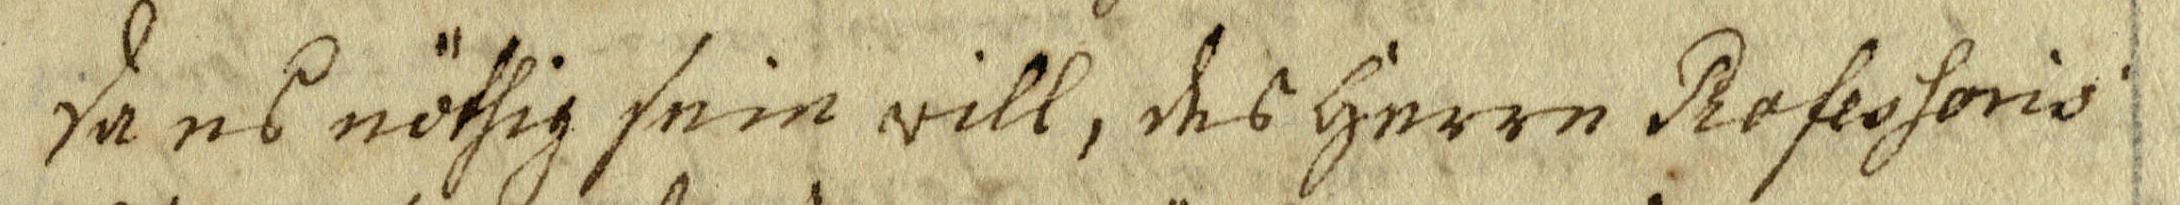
Da es nöthig sein will, des Herrn Professoris
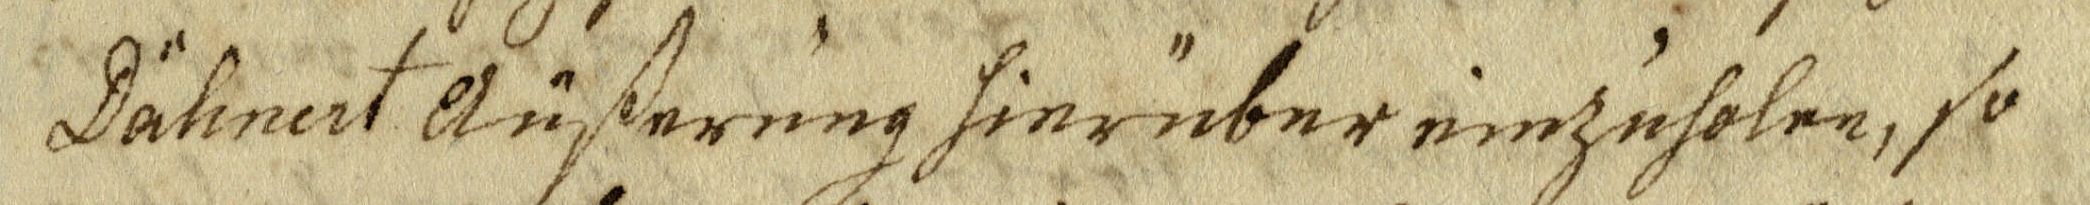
Dähnert Äußerung hierüber einzuholen, so
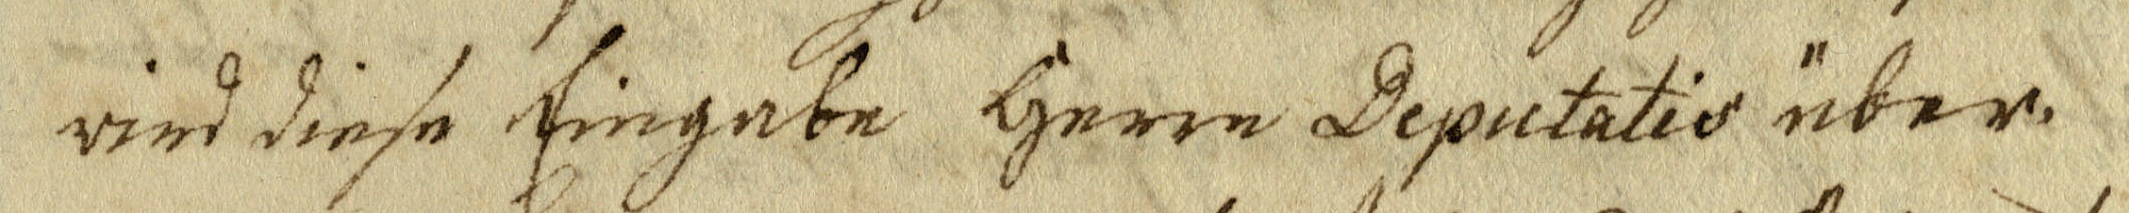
wird diese Eingabe Herrn Deputatis über¬
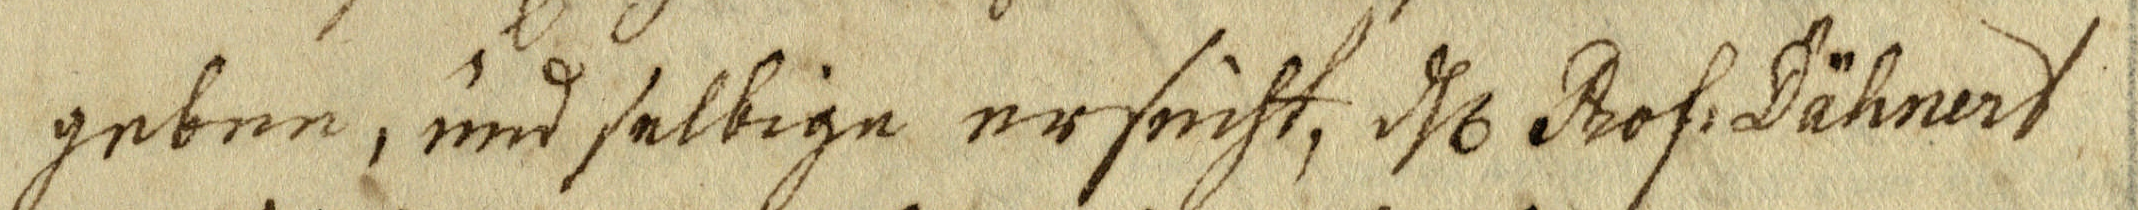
geben, und selbige ersucht, dh Prof. Dähnert
